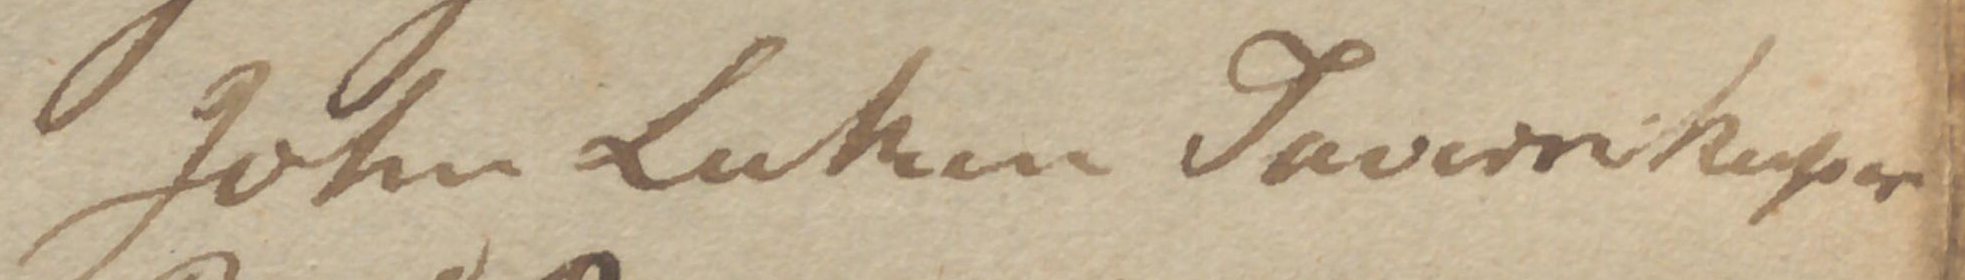John Luken Tavernkeeper
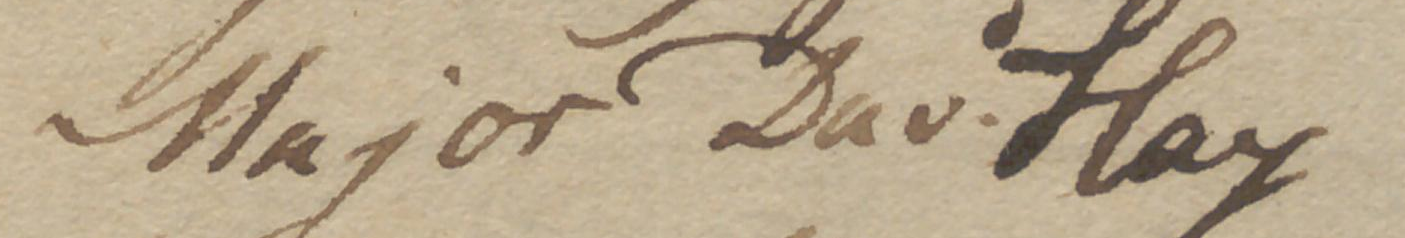Major Dav^d. Hay
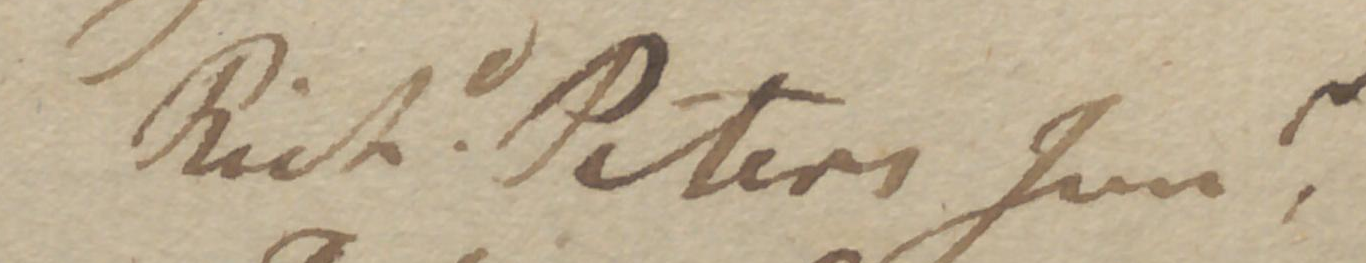Rich^d. Peters Jun^r.
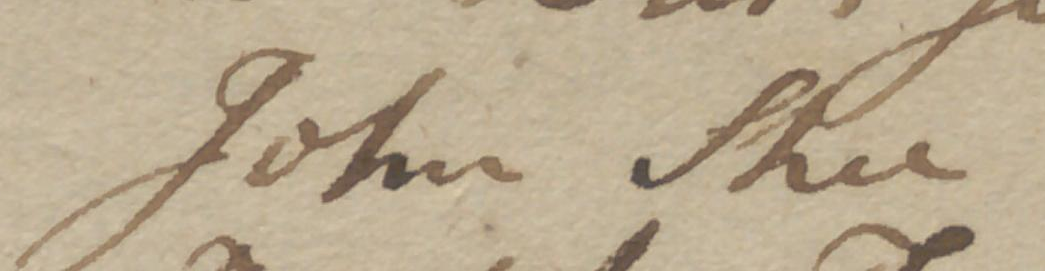John Shee
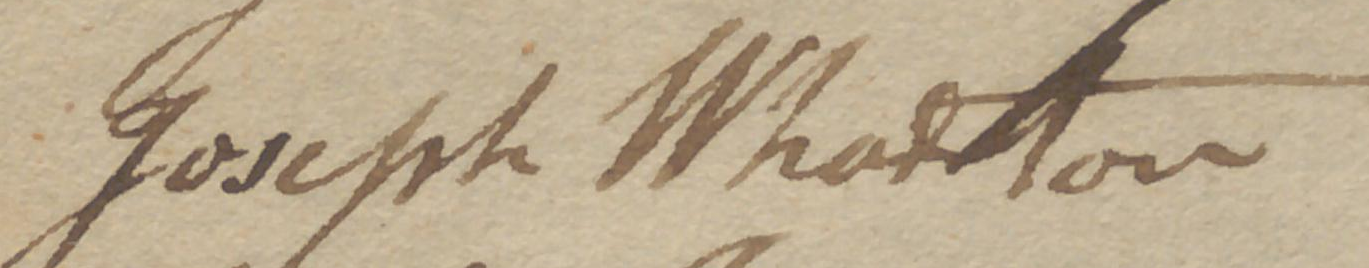Joseph Wharton
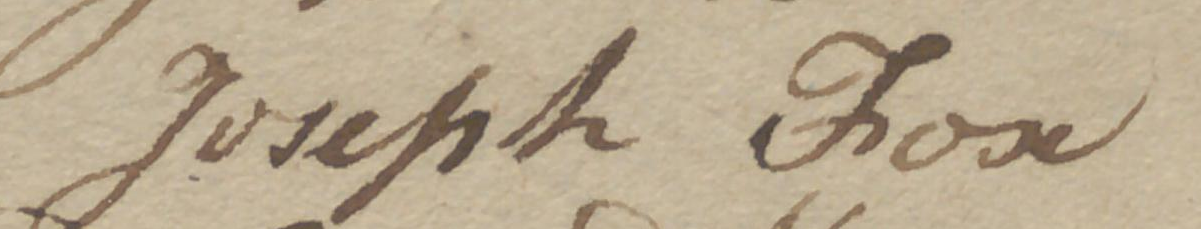Joseph Fox
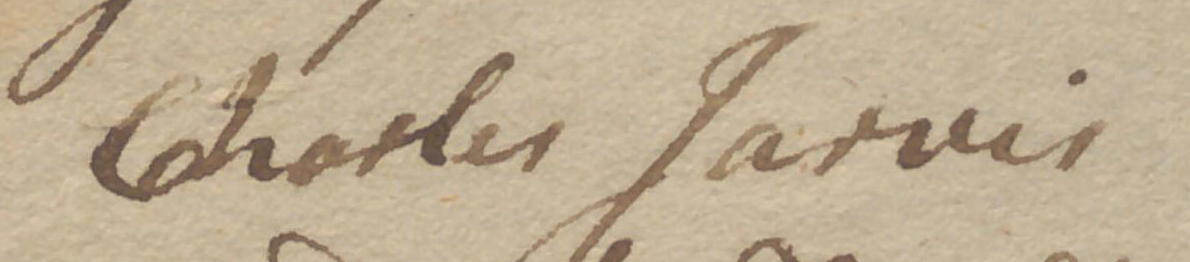Charles Jarvis
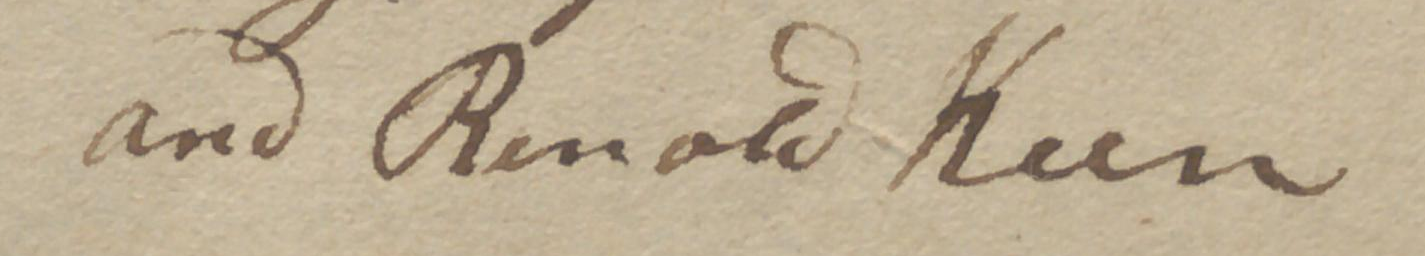and Renold Kun
